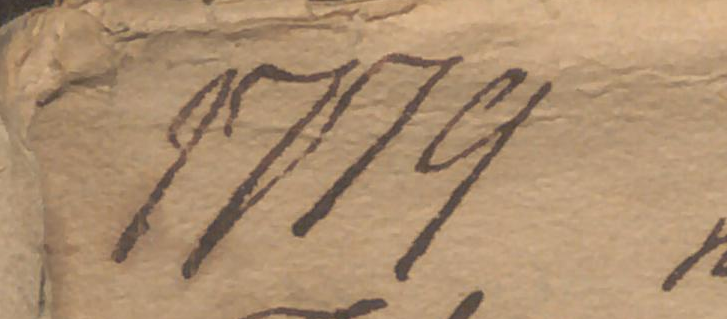1779
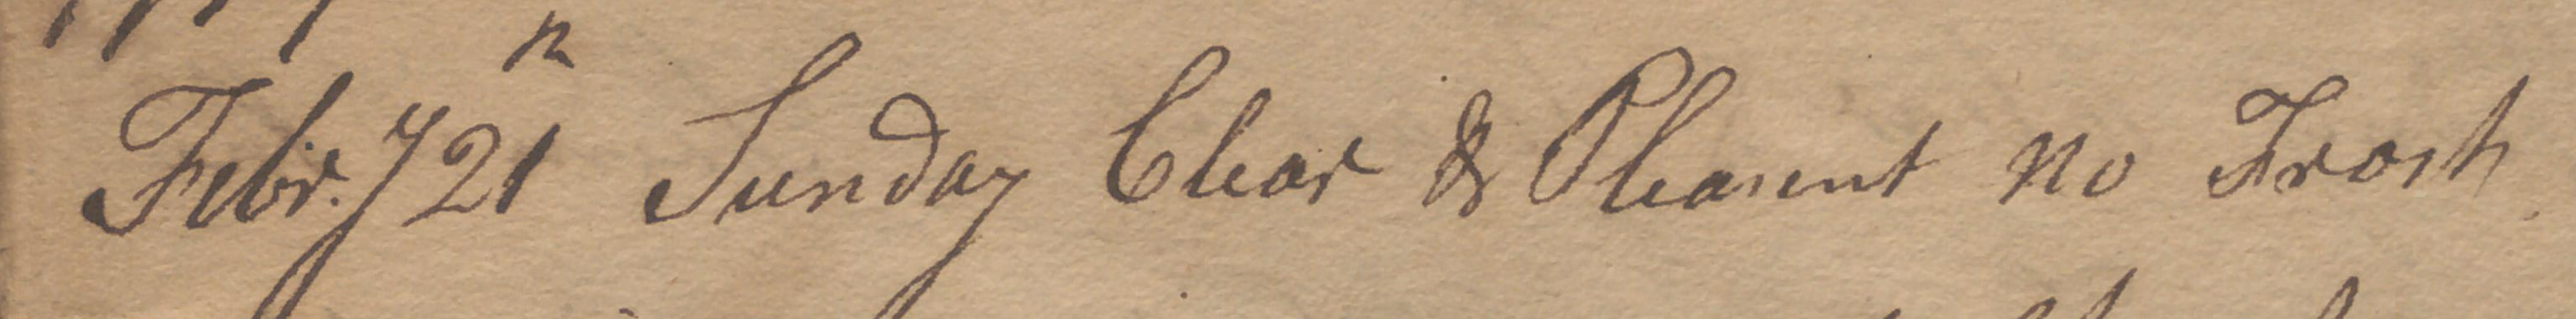Febr^y. 21^th Sunday Clear & Pleasent no Frost
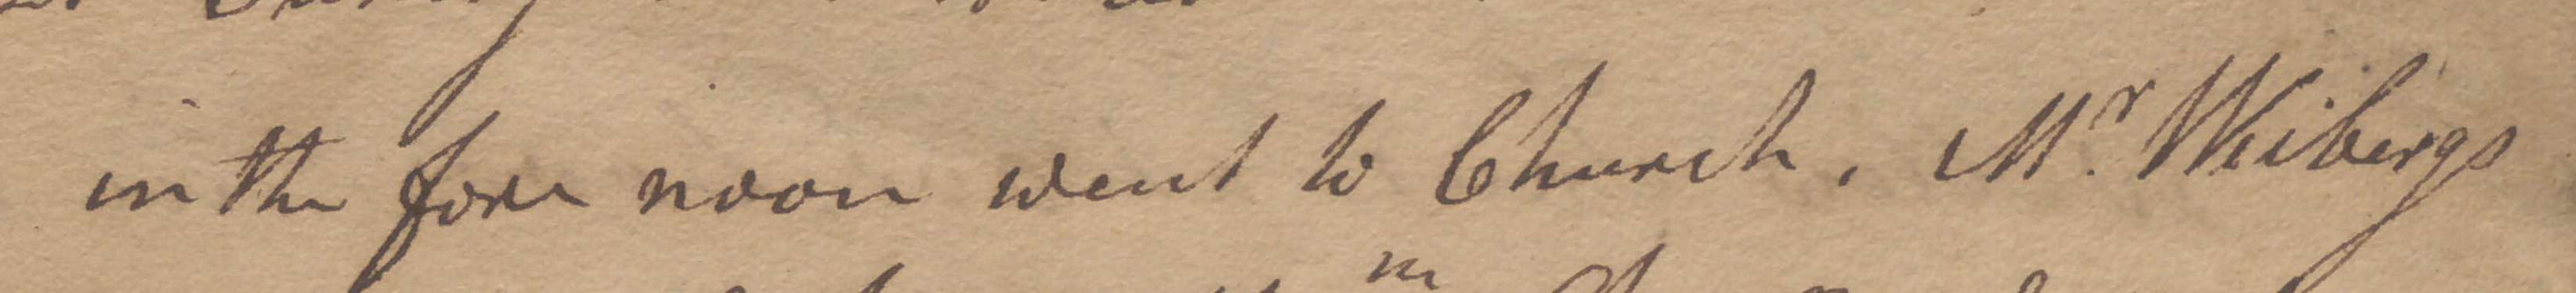in the fore noon went to Church, M^r. Wibergs
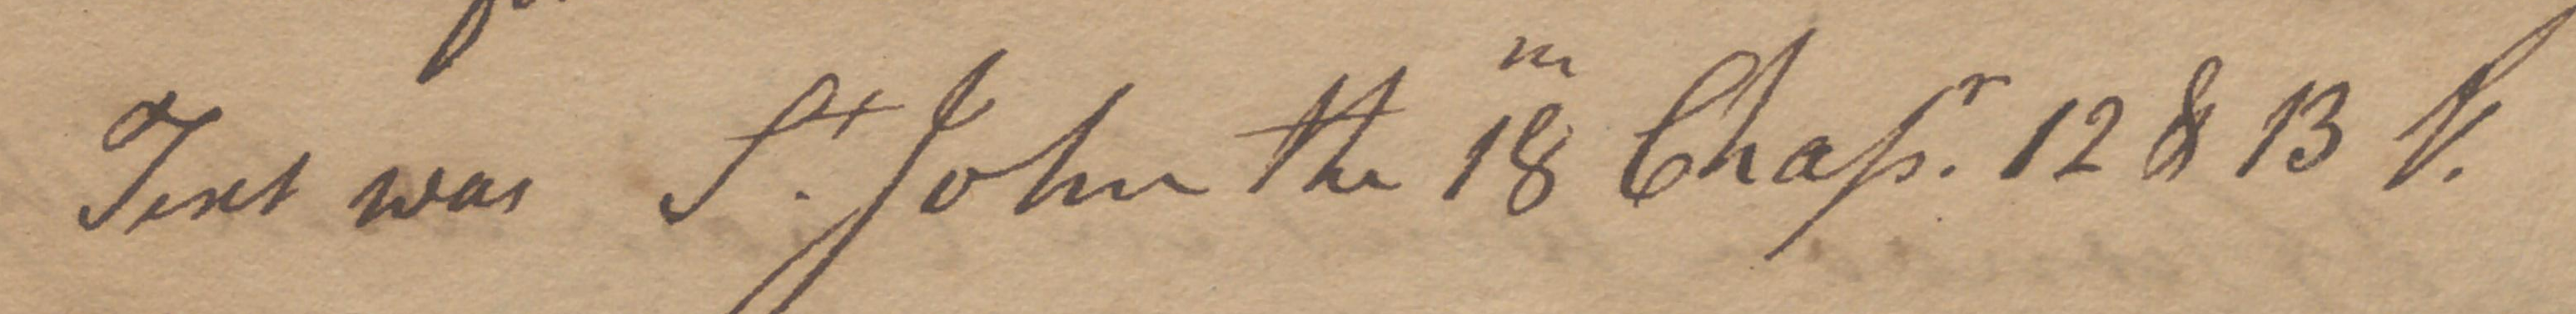Text was S^t. John the 18^th Chap^r. 12 8 V.
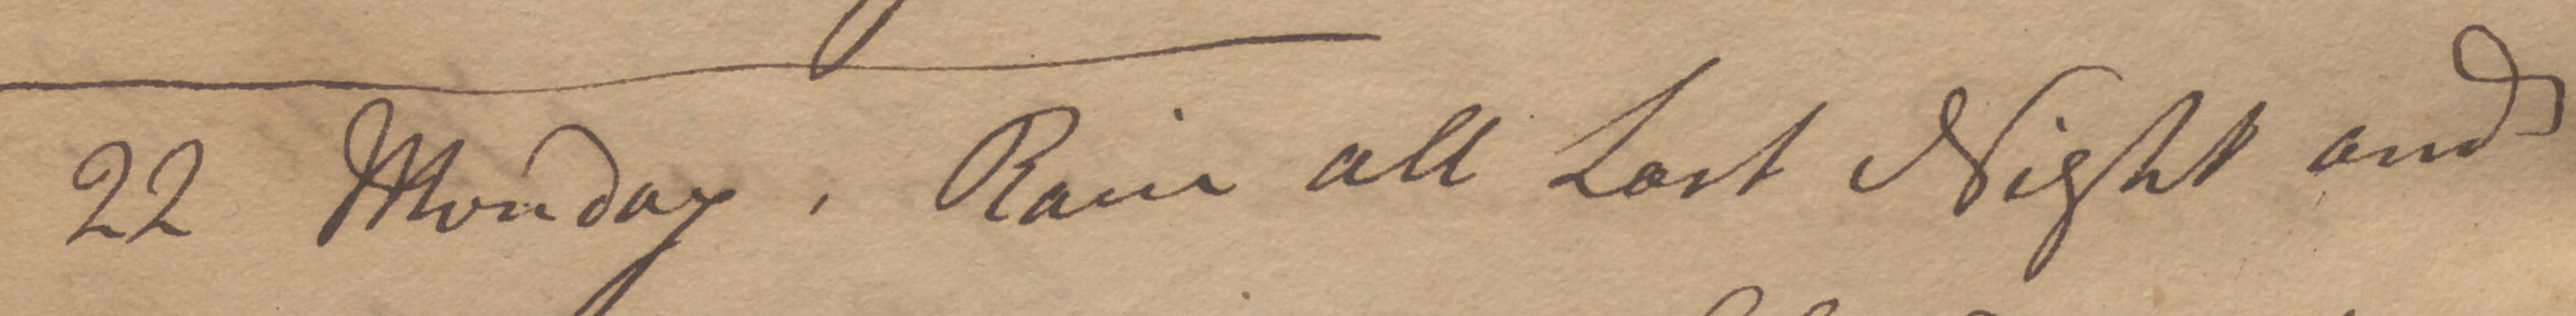22 Monday. Rain all Last Night and
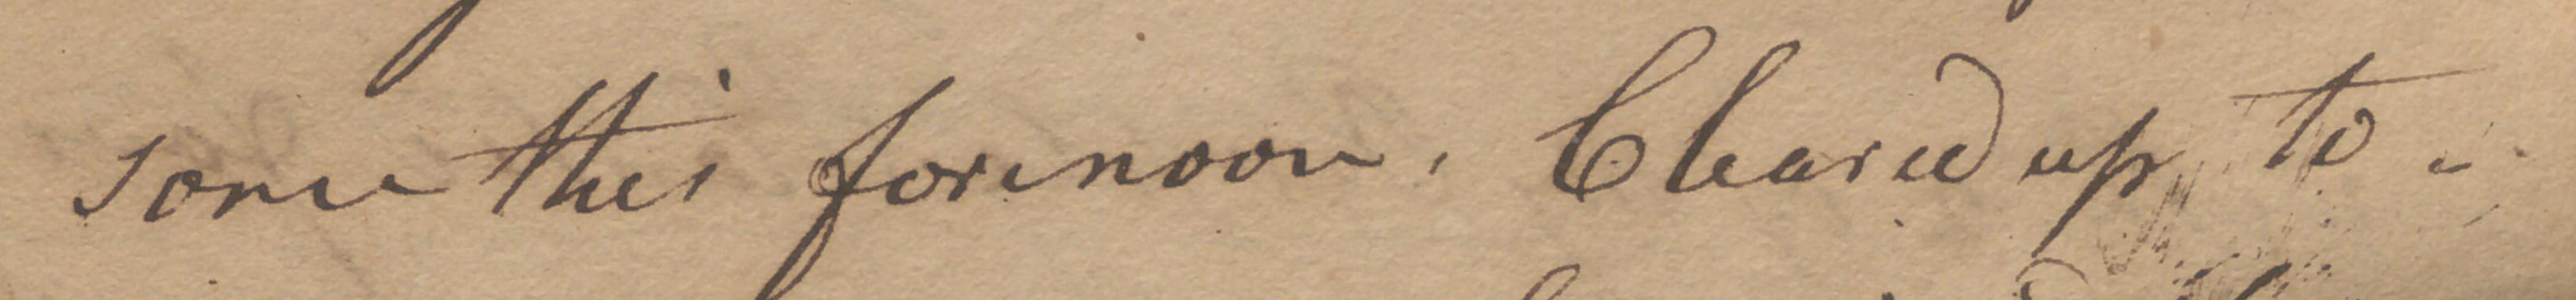sence this forenoon. Cleared up to-
